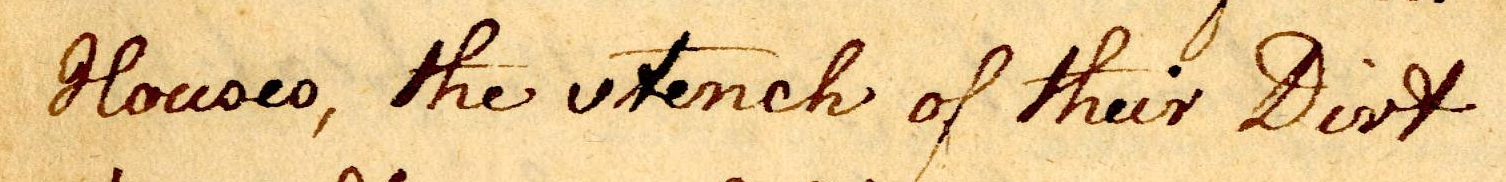Houses, the stench of their Dirt
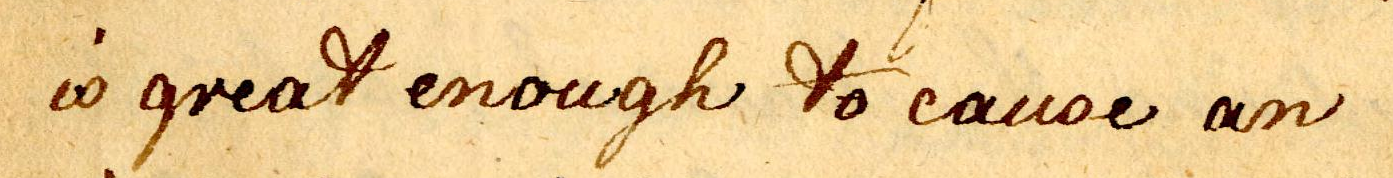is great enough to cause an
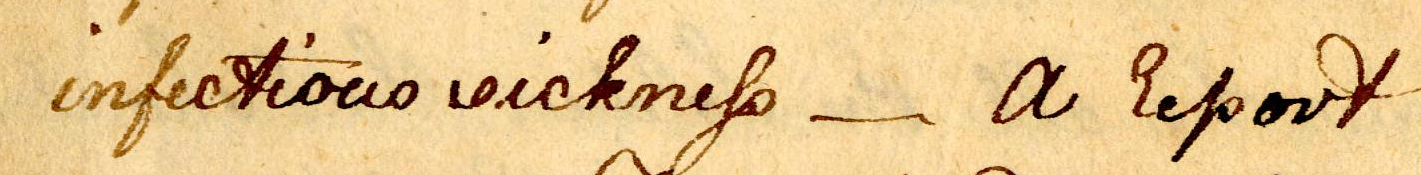infectious sickness- A report
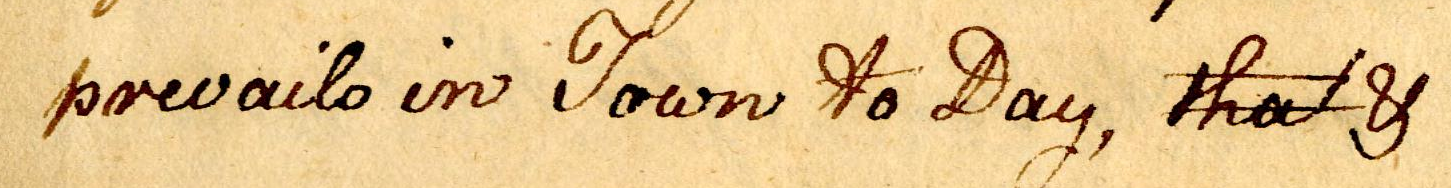prevails in Town to Day, [that] &
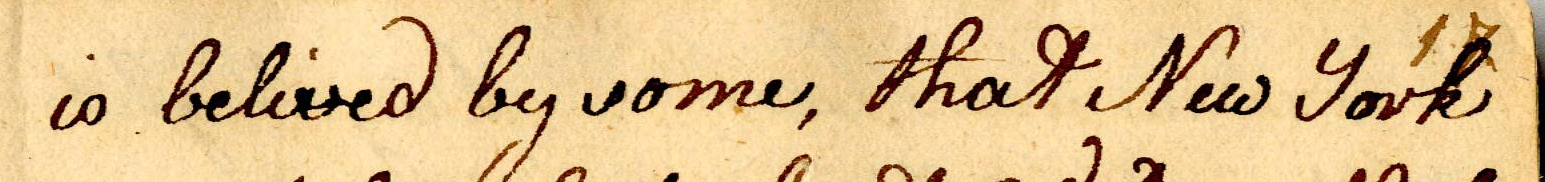is believed by some, that New York
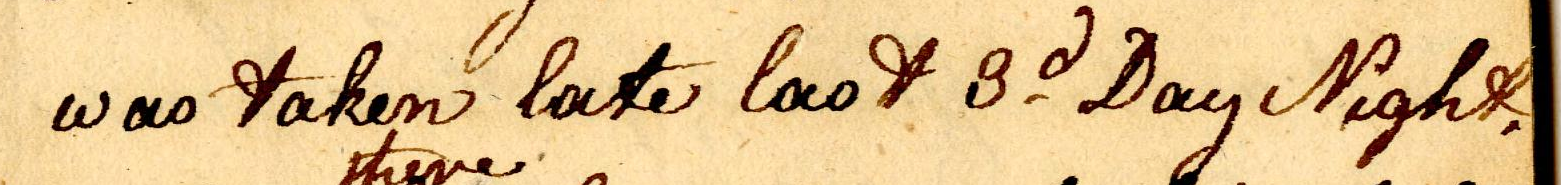was taken late last 3^d. Day Night.
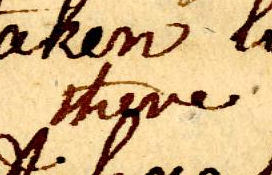there
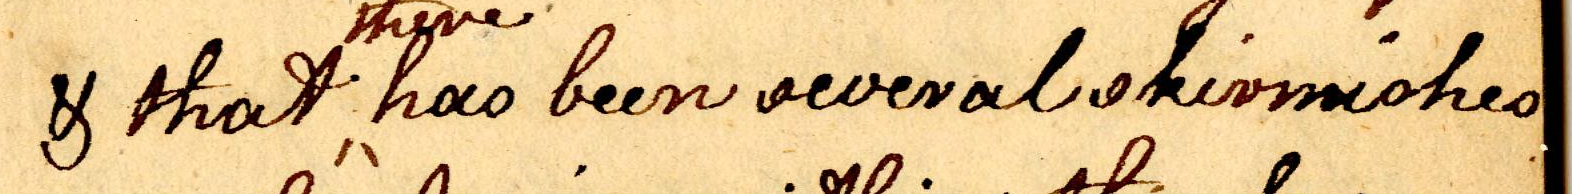& that ^ has been several skirmishes
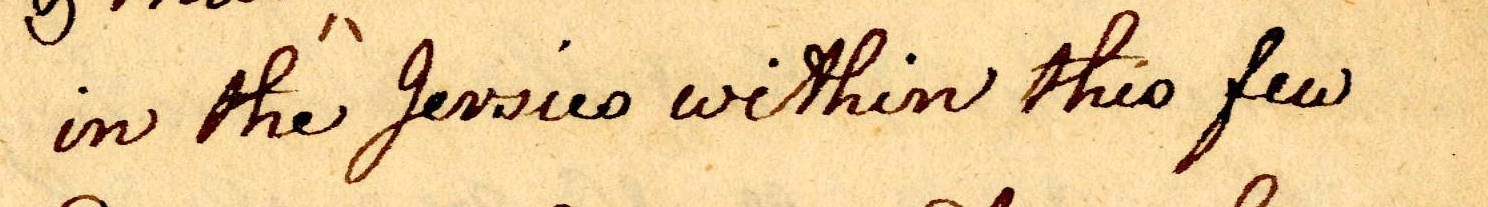in the Jersies within this few
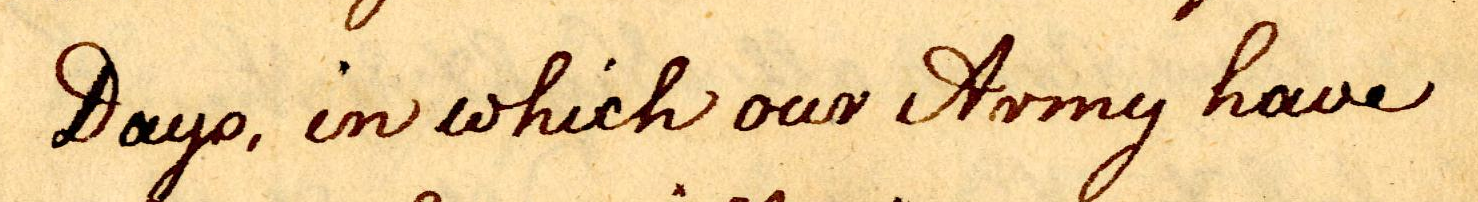Days, in which our Army have
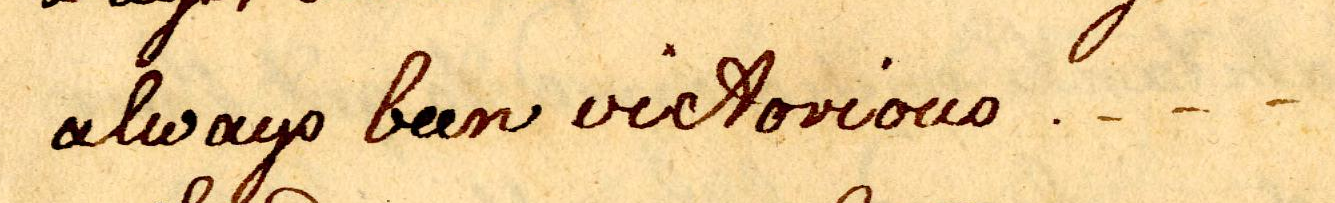always been victorious.-
